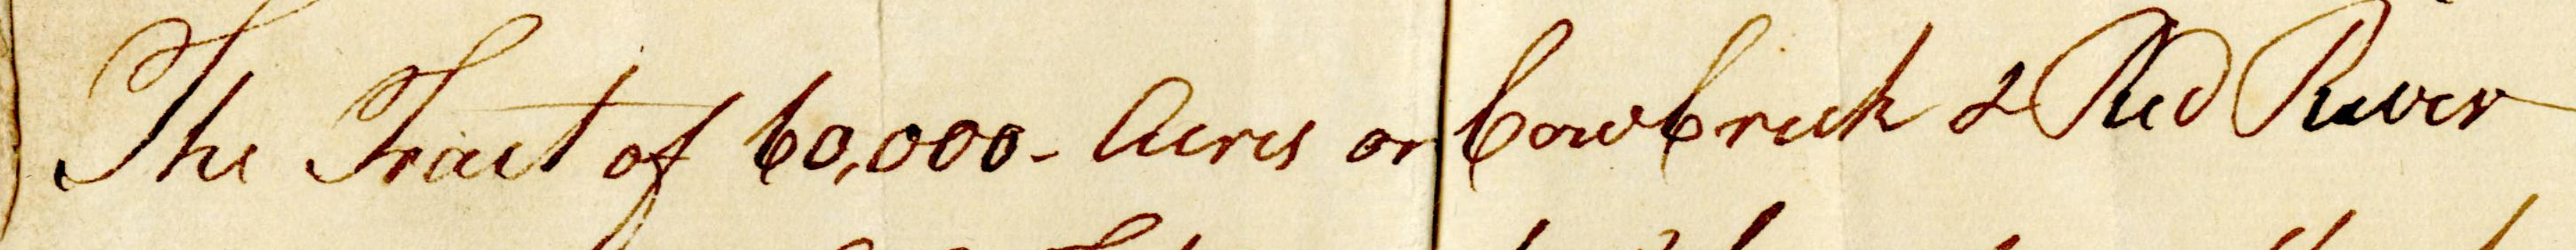The Tract of 60,000. Acres or Cowbrick & Red River.
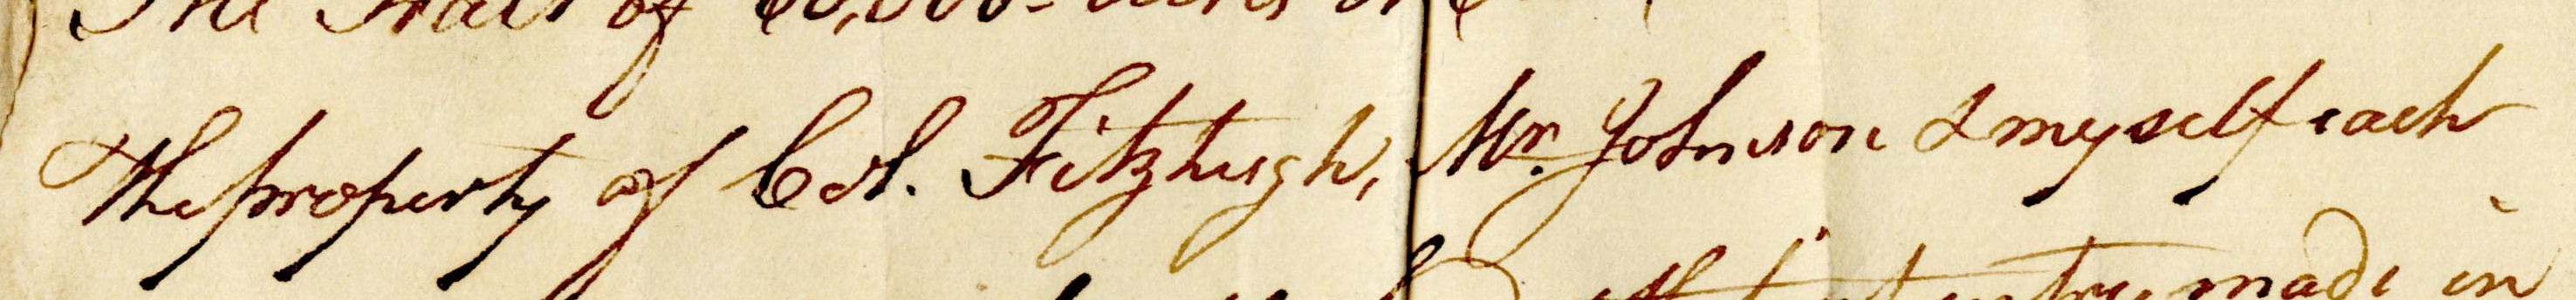the property of Col. Fitzhugh, M^r. Johnson & myself each
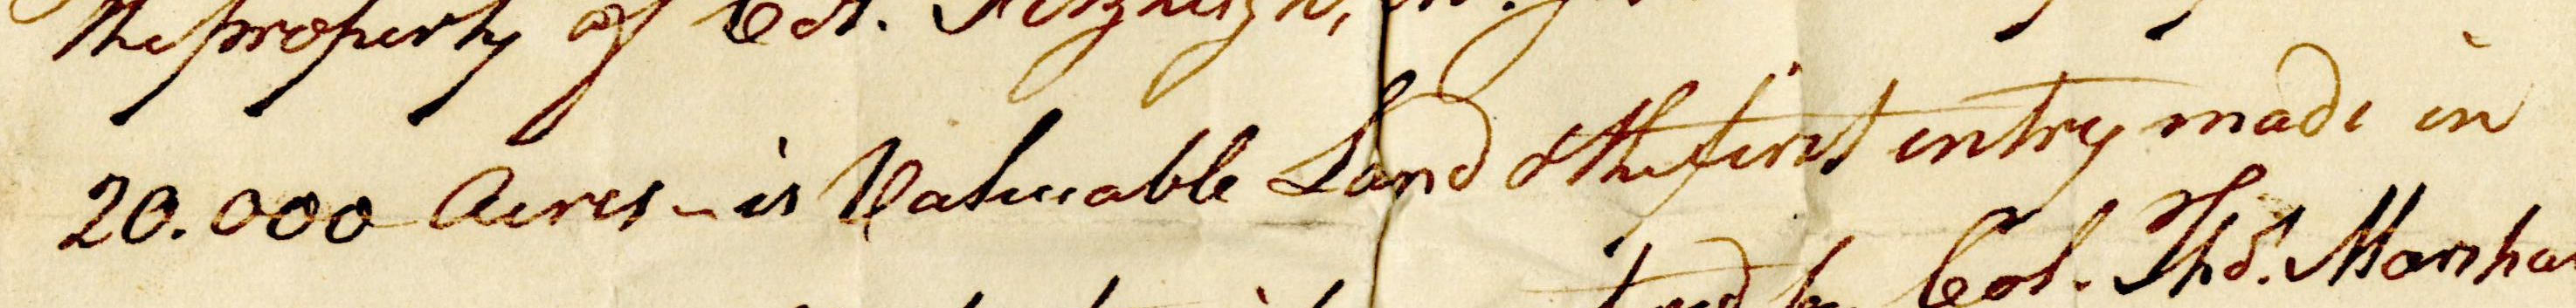20.000 Acres- is valuable Land & the first entry made in
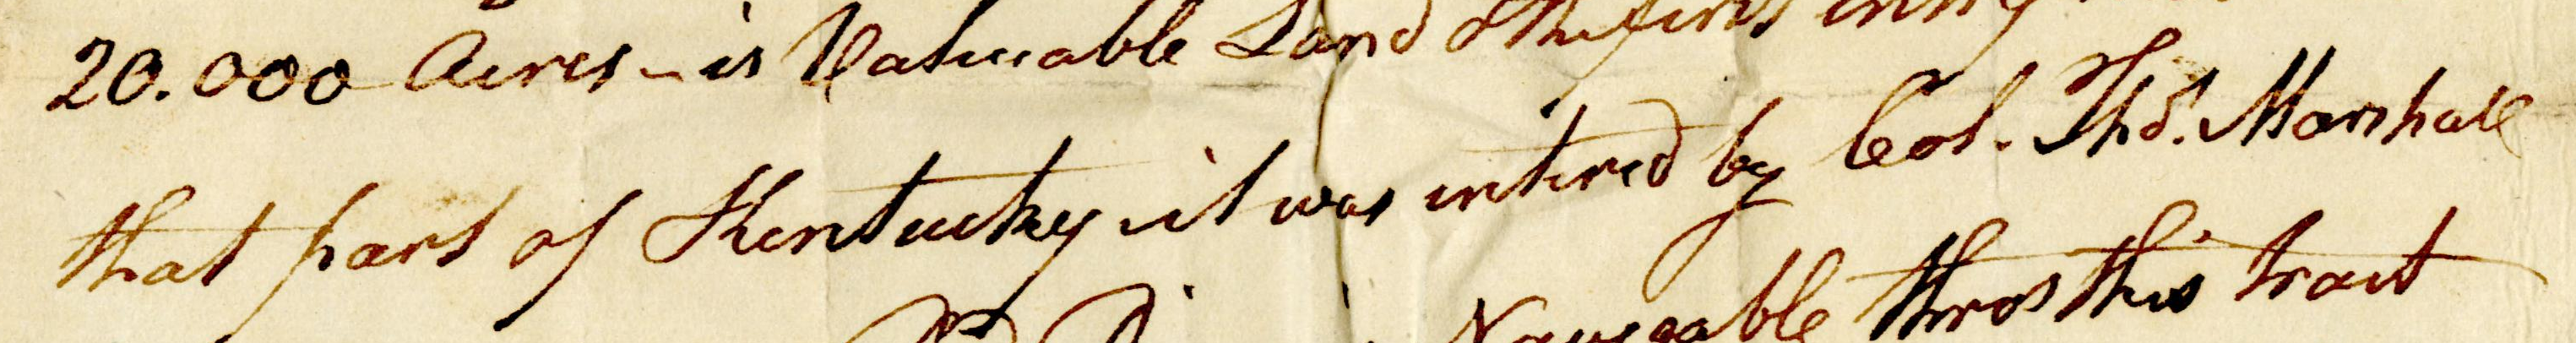that part of Kentucky it was united by Col. Tho^s. Marshall
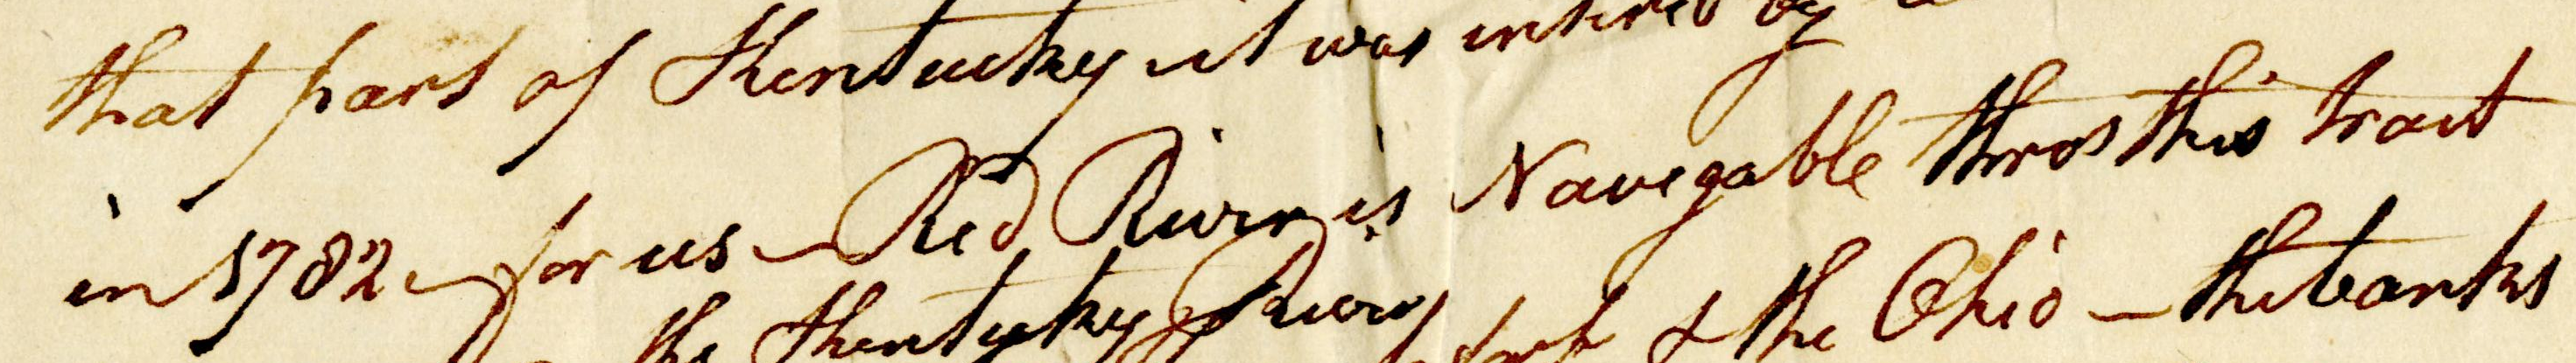in 1782 for us- Red River is Navigable throu this tract
